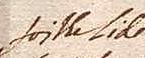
foi lhe lido
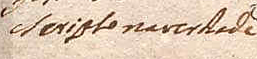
escripto na verdade
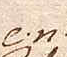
c. n.
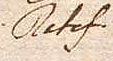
Ratif.
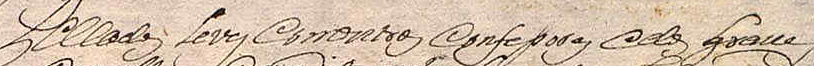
Peccados leves com outros confessores e dos graues
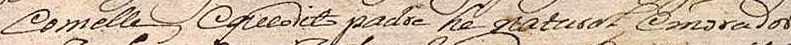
com elle, e que o dito padre he natural, e morador
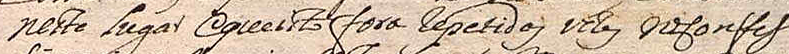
neste lugar e que isto fora repetidas vezes no confes
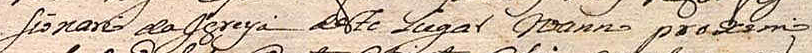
sionario da Jgreija deste Lugar no anno proximo
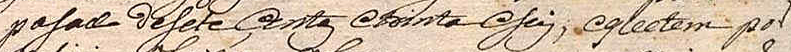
pasado de seteçentos e trinta e seis, e que tem por
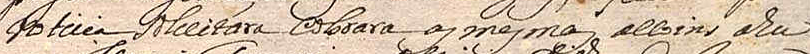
noticia solicitara e obrara as mesmas accoins a hu
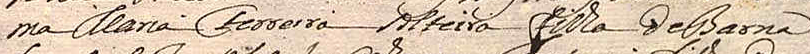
ma Maria Ferreira solteira filha de Barna
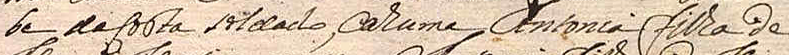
be da Costa soldado, e a huma Antonia filha de
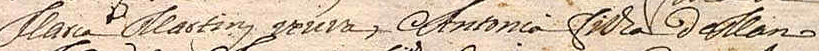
Maria Martins veuva, e Antonia filha de Mano
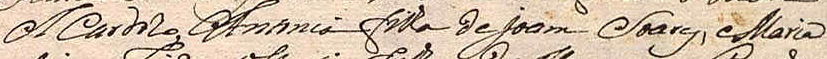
el Cardozo, e Antonia filha de Joam Soares, e Maria
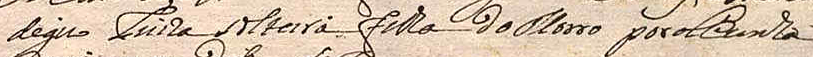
diguo Luiza solteira filha do Morro por alcunha
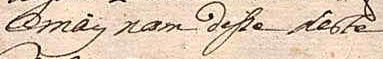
e mais nam disse deste
